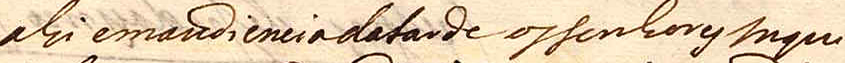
ahi em audiencia da tarde os senhores Inqui
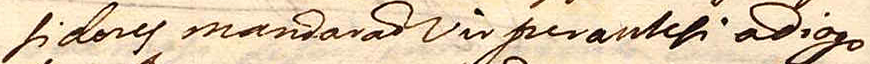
sidores mandarão vir perante si a diogo
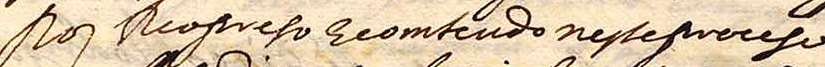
Roz Reo preso E comteudo neste proceso
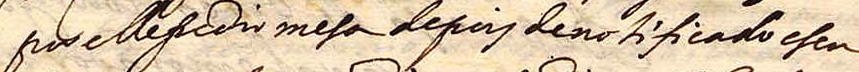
por elle pedir mesa depois de notificado e sen
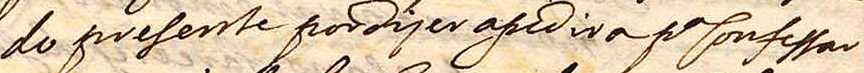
do presente por dizer a pedira pa Confessar
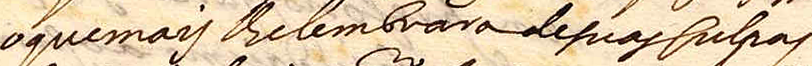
o que mais lhe lembrara de suas Culpas
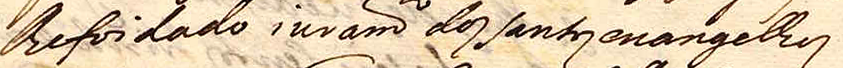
lhe foi dado iuramto doz Santoz euangelhoz
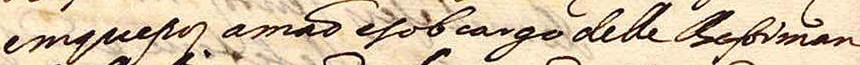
em que poz a mão e sob cargo delle lhe foi man
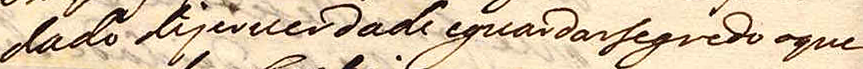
dado dizer uerdade e guardar segredo o que
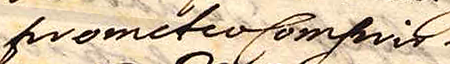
prometeo Comprir
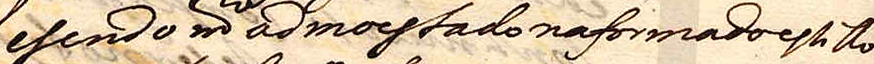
e sendo mto admoestado na forma do estillo
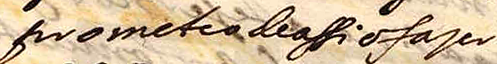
prometeo de assi o fazer
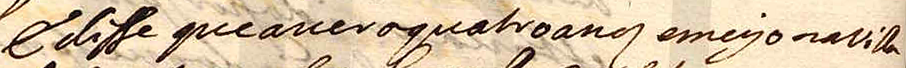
E disse que auera quatro anoz e meyo na villa
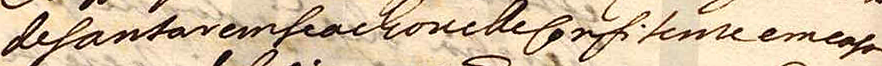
de santarem se achou elle Confitente em casa
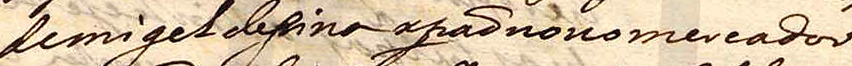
de migeL de pina xꝑão nouo mercador
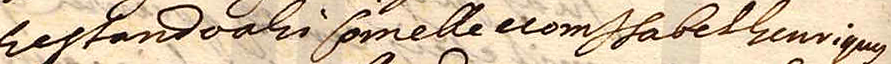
E estando ahi Com elle e com JsabeL henriques
